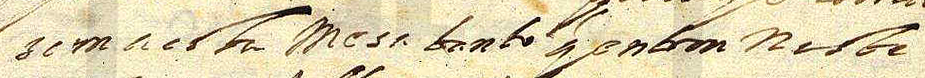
sem a esta mesa tanto q̄ entrou neste
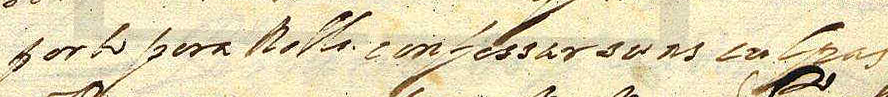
porto pera nella confessar suas culpas
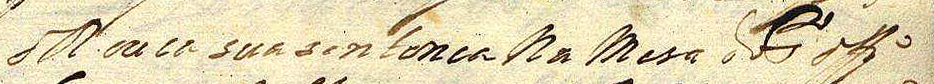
o R ouca sua sentença na mesa do sto offo
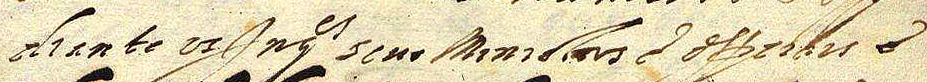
diante os Jnqes seus ministros e officiais e
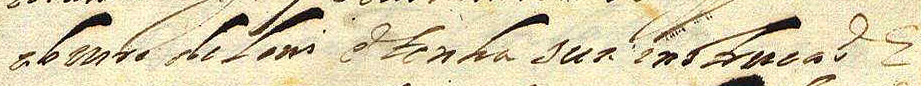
abiure de leui e tenha sua instruçaõ E
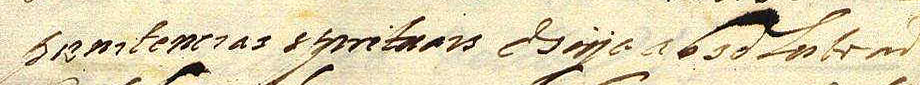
penitencias spirituais e seija absoluto ad
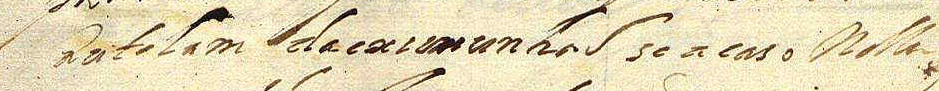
Cautelam da excomunhaõ se acaso nella
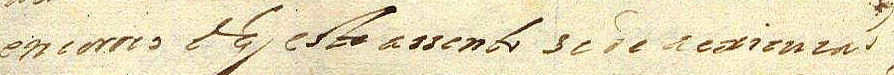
encorreo e q̄ este assento se de a exicuçaõ
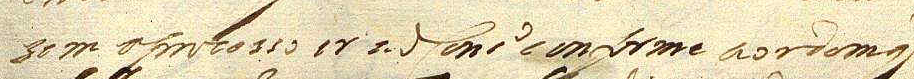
sem o processo ir ao Conso conforme a ordem q̄
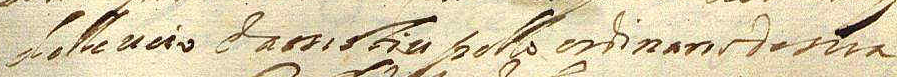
delle ueio e assistiu pello ordinario de sua
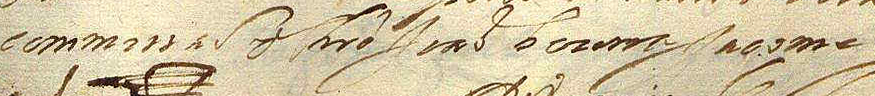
commissaõ o Chrē Joaõ bezerra Jacome
